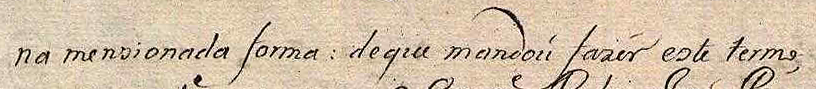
na mensionada forma: de que mandou fazér este termo,
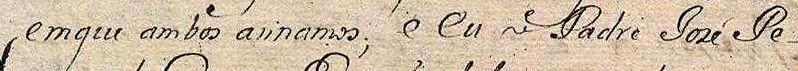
em que ambos asinamos; e eu o Padre Iozé Pe
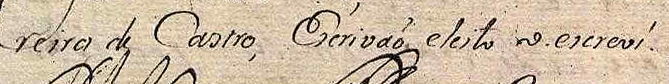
reira de Castro, Escrivaõ eleito o escrevi.
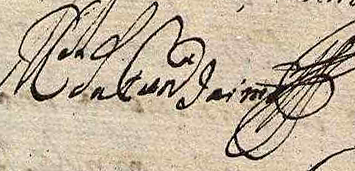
M.el da Fonc.a Iaime
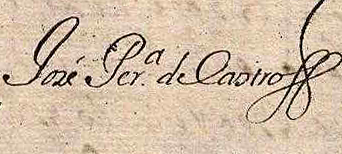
Iozé Per.a de Castro
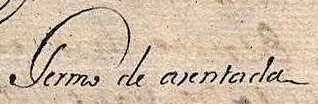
Termo de asentada
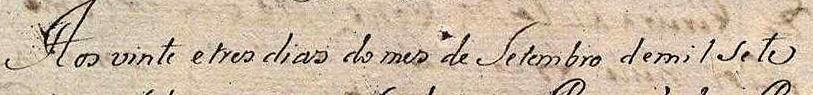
Aos vinte e tres dias do mes de Setembro de mil sete
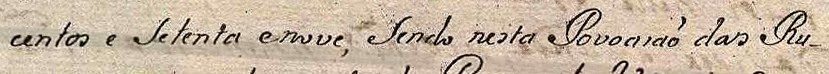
centos e setenta e nove, sendo nesta Povoasaõ das Ru
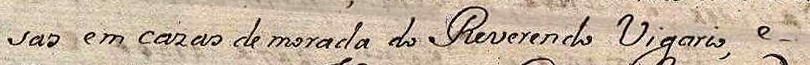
sas em cazas de morada do Reverendo Vigario, e
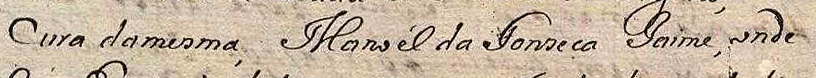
Cura da mesma, Manoel da Fonseca Iaime, onde
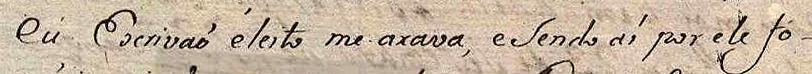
Eu Escrivaõ eleito me axava, e sendo aí por ele fo
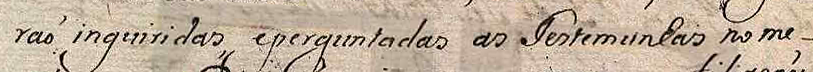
raõ inquiridas, e perguntadas as Testemunhas nome
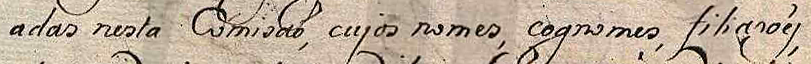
adas nesta Cōmisaõ, cujos nomes, cognomes, filiasoẽs,
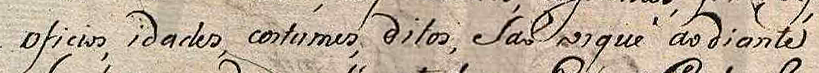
oficios, idades, costumes, ditos, Saõ os que ao diante
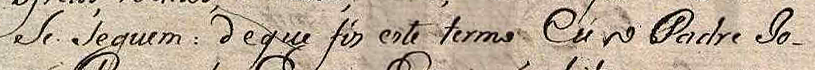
se seguem: de que fiz este termo Eu o Padre Io
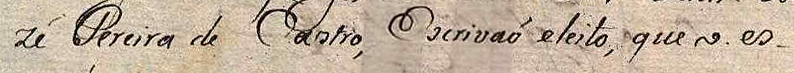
ze Pereira de Castro, Escrivaõ eleito, que o es
